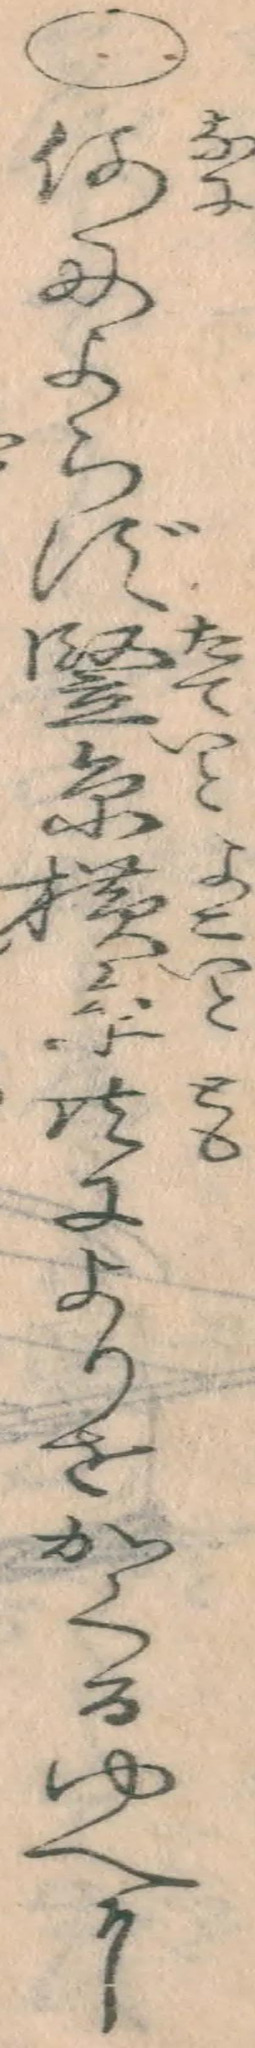○何によらず竪糸横糸共によりをかくるゆへに
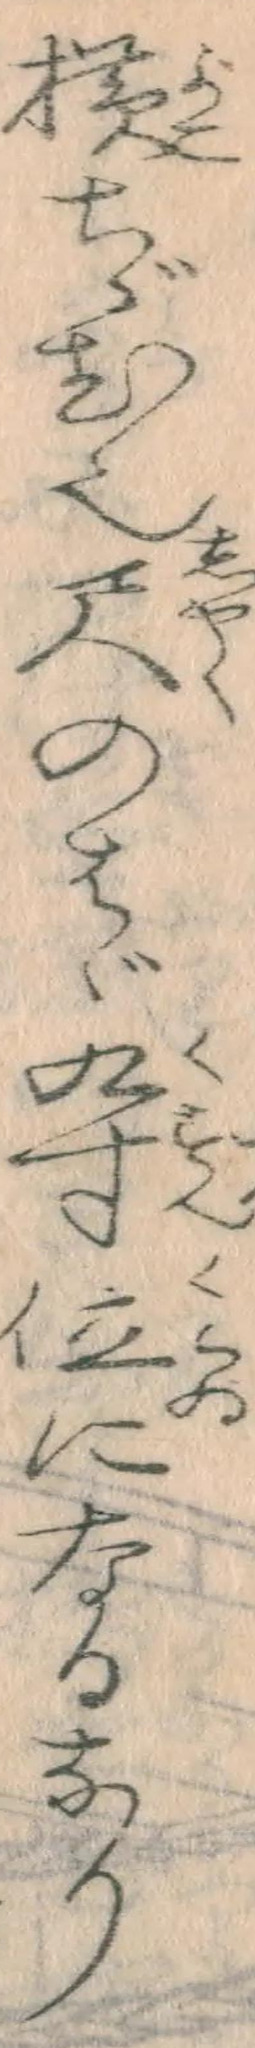横ちゞむ也尺のはゞ九寸位になるなり
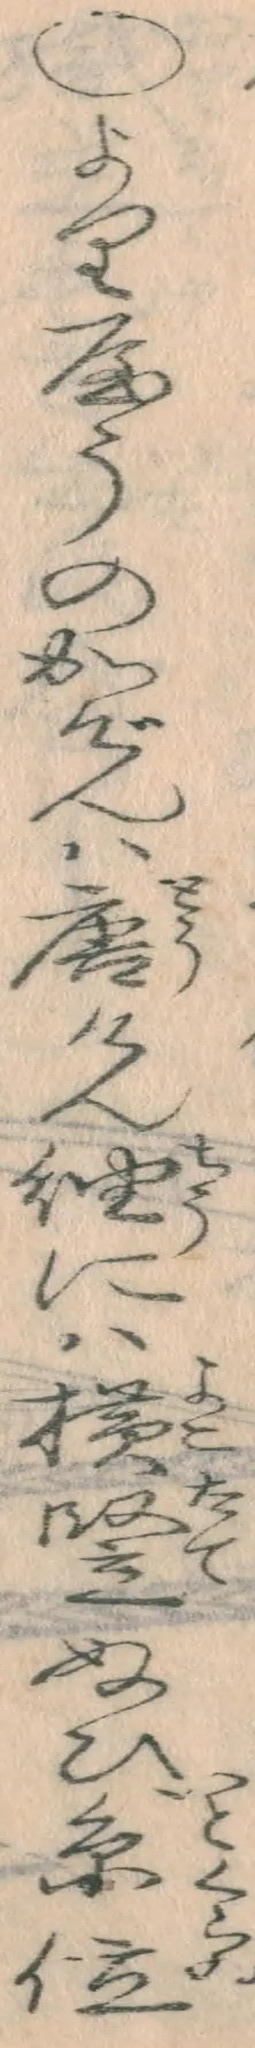○よりやうのかげんは唐けん紬には横竪ぬひ糸位
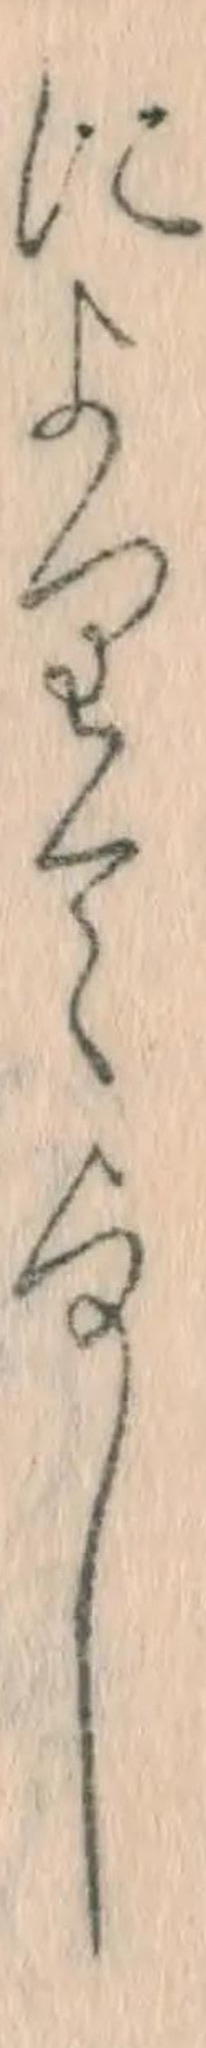によりてよし
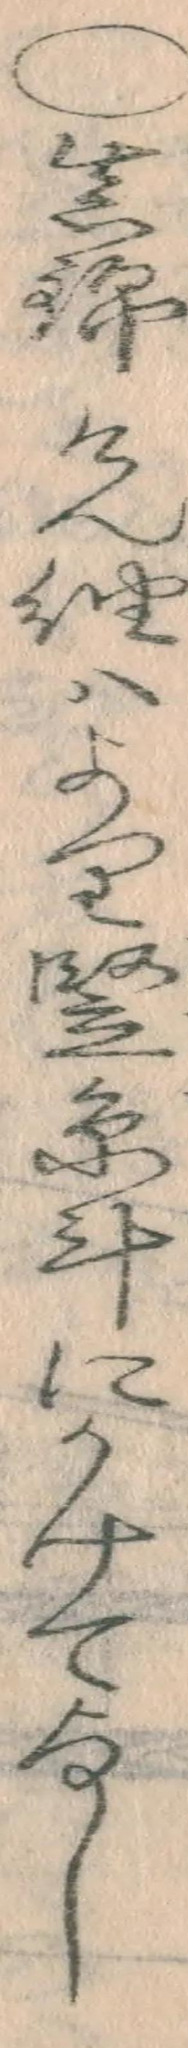○真綿けん紬はより竪糸斗にかけてよし
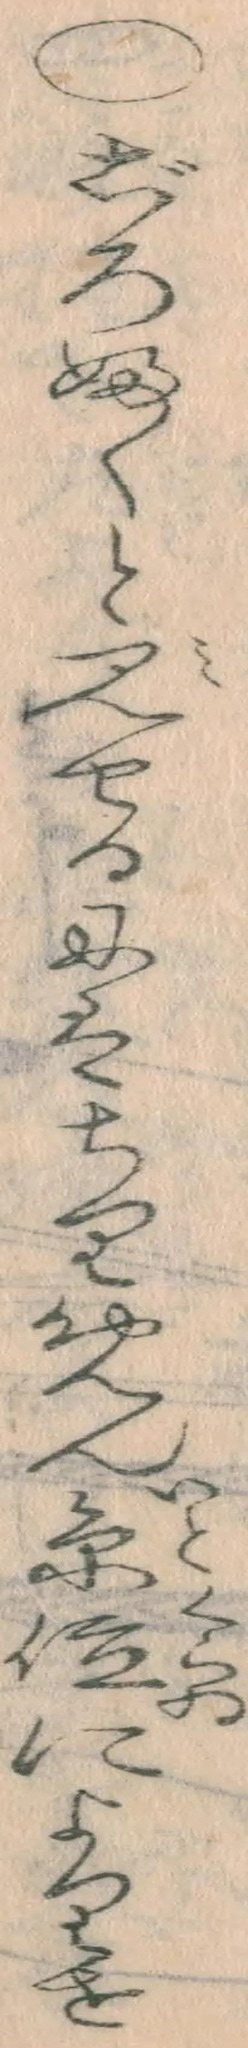○ごろふくと見せるにはちりめん糸位によりを
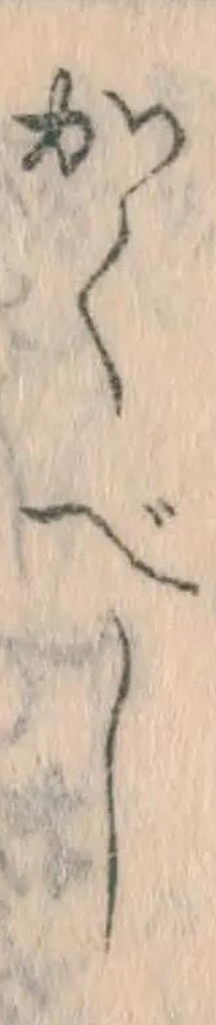かくべし
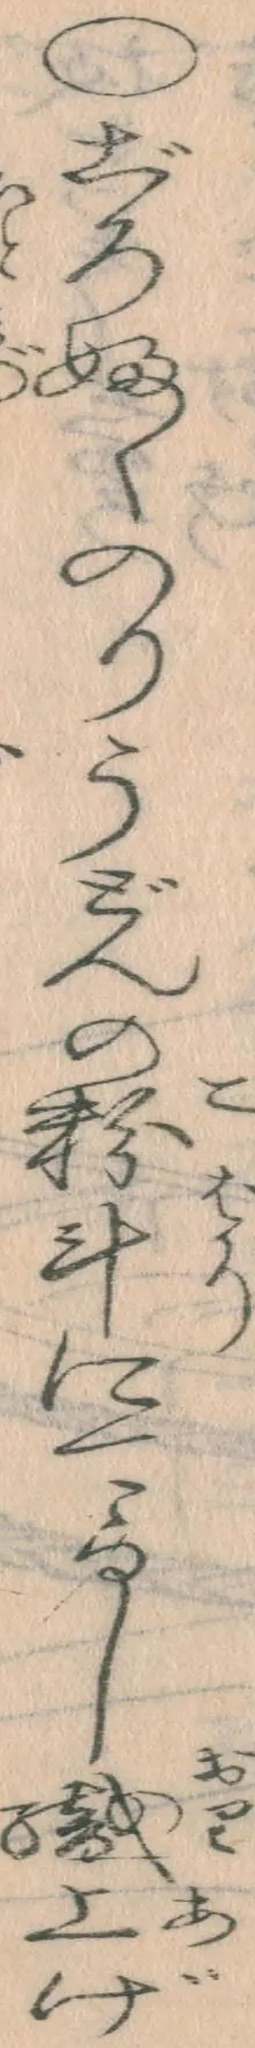○ごろふくのいうどんの粉斗にてよし織上げ
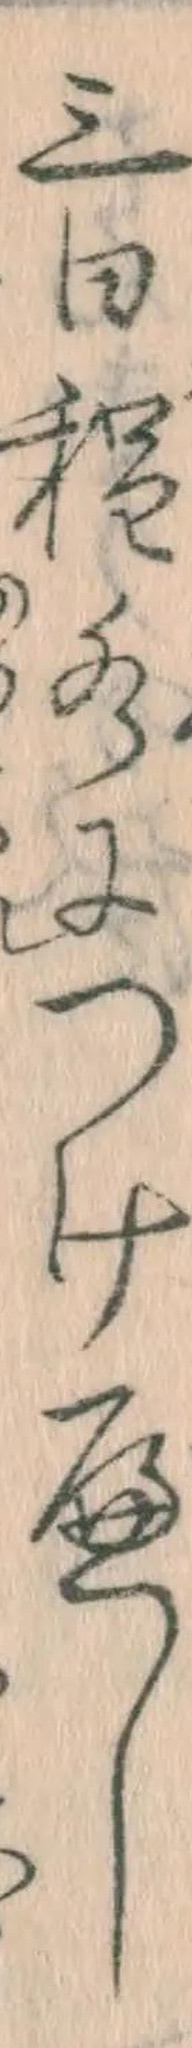三日程水につけべし
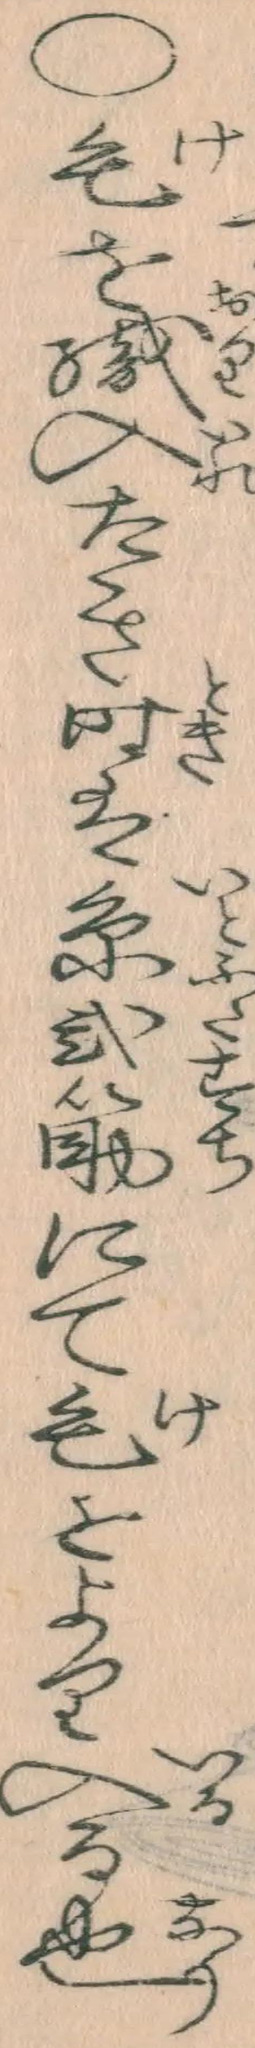○毛を織入たき時は糸弐筋にて毛をより入る也
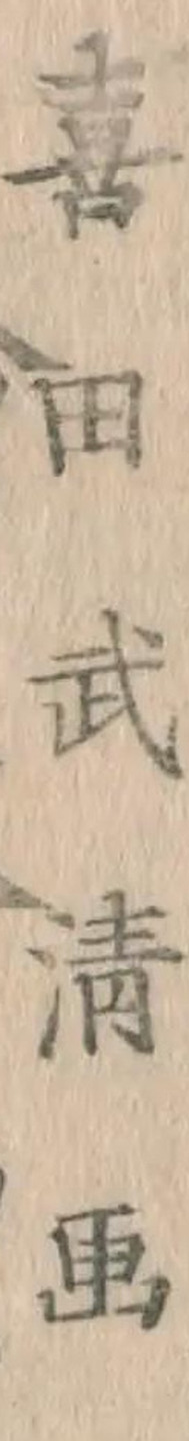喜田武清画
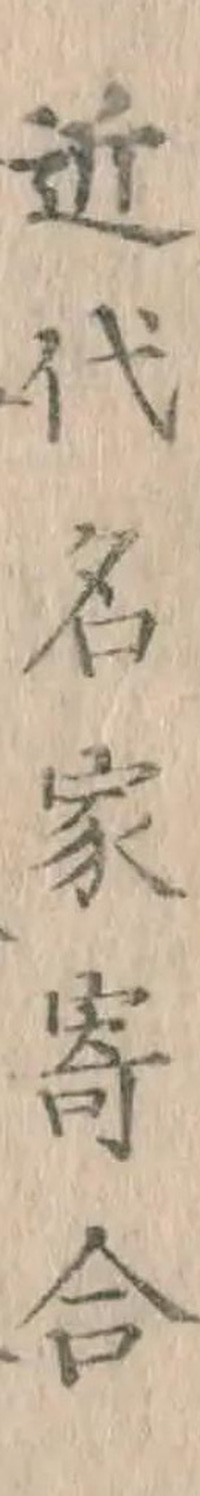近代名家寄合
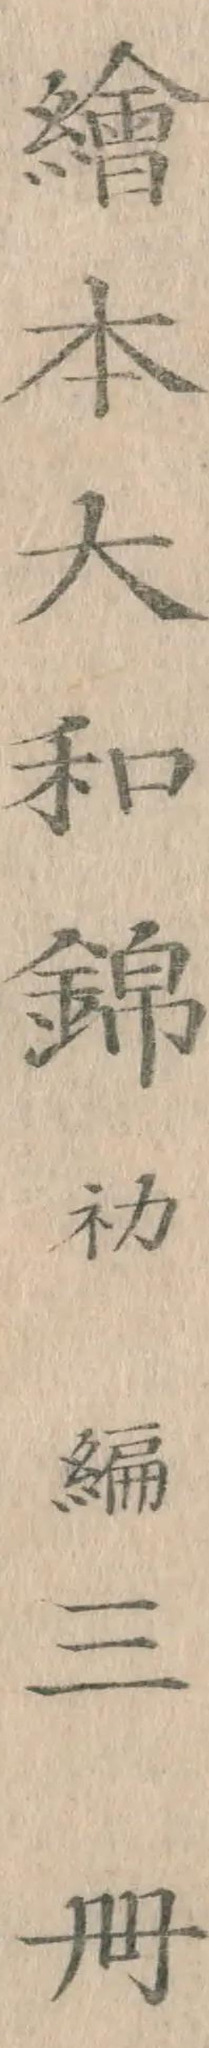絵本大和錦初編三冊
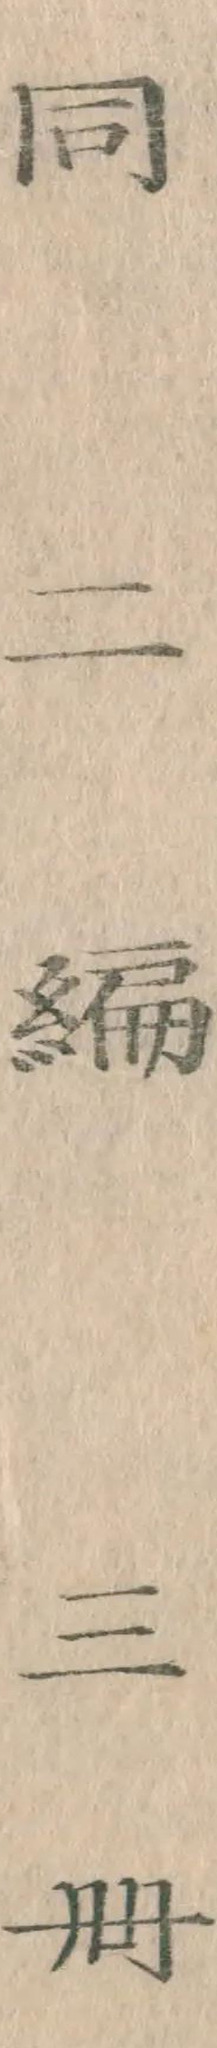同二編三冊
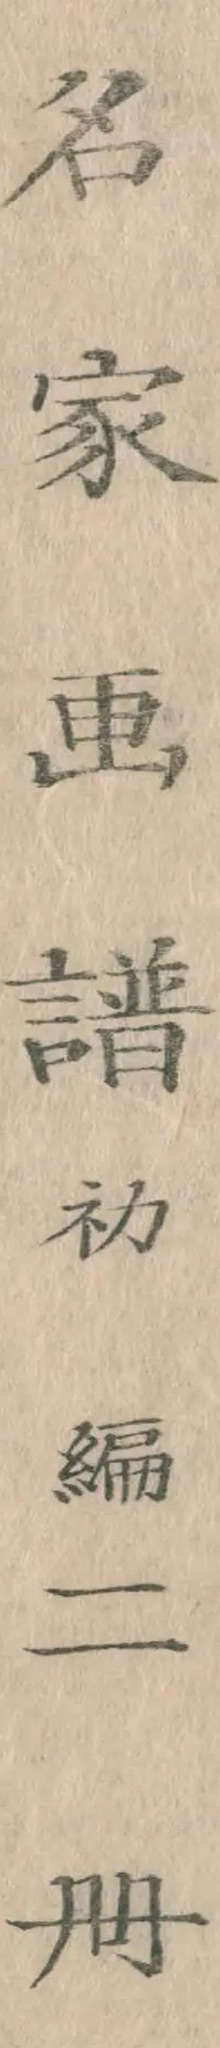名家画譜初編二冊
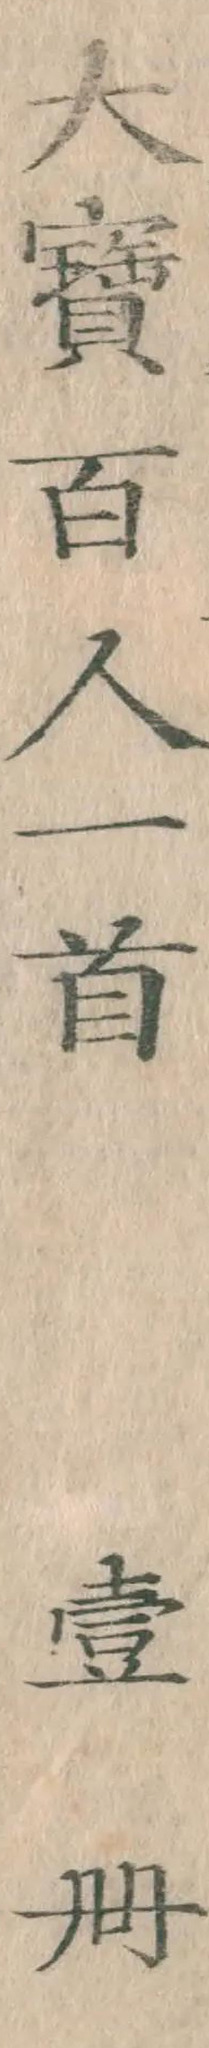大宝百人一首壱冊
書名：山繭養法秘傳抄
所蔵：国立国会図書館 National Diet Library, JAPAN
